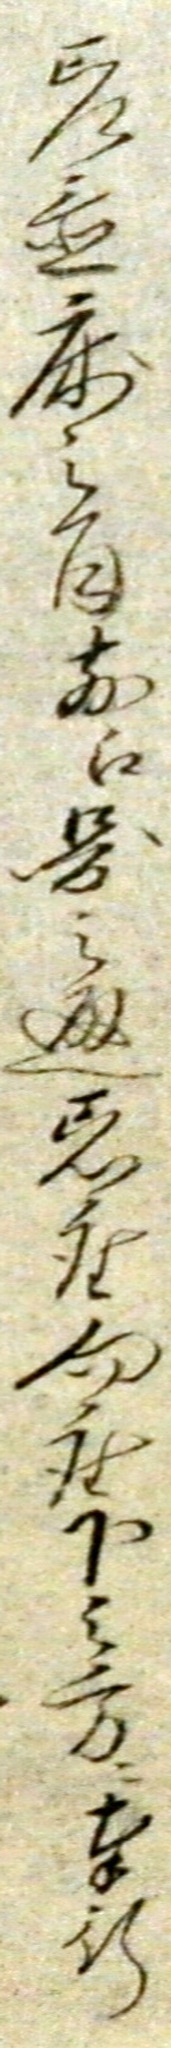差置床之間前江図之通着座向座下之方ニ奉行
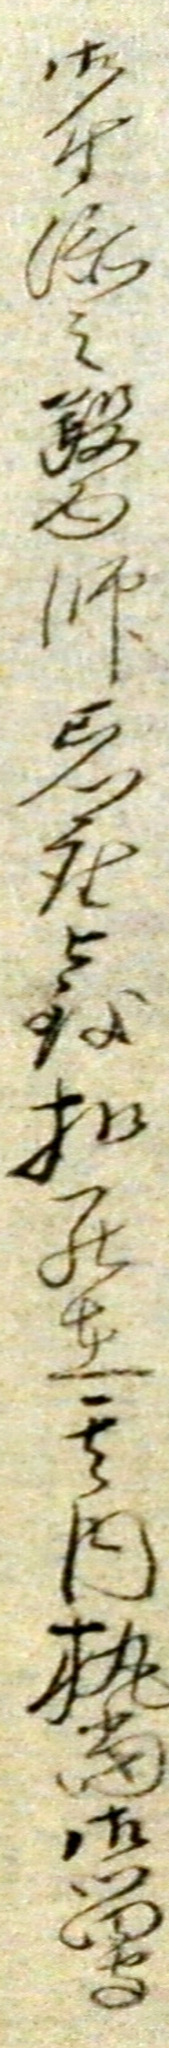御付添之医師着座ヒ致扣罷在其内執當御留守
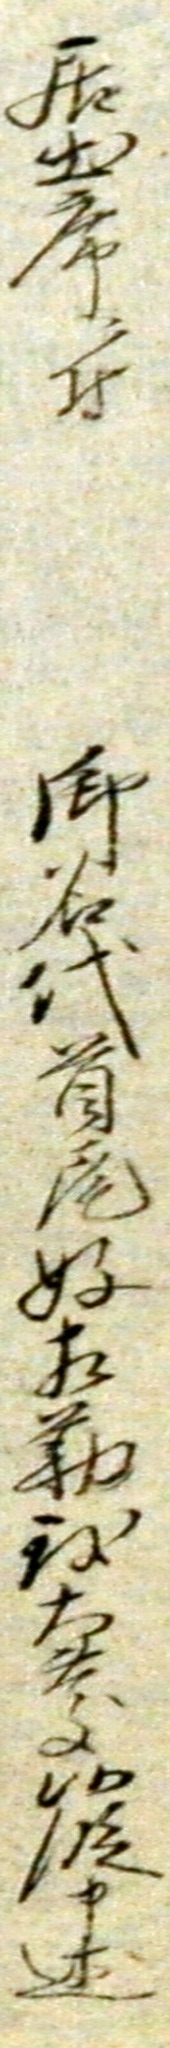居出席ニ付御名代首尾好相勤致大慶候段申述
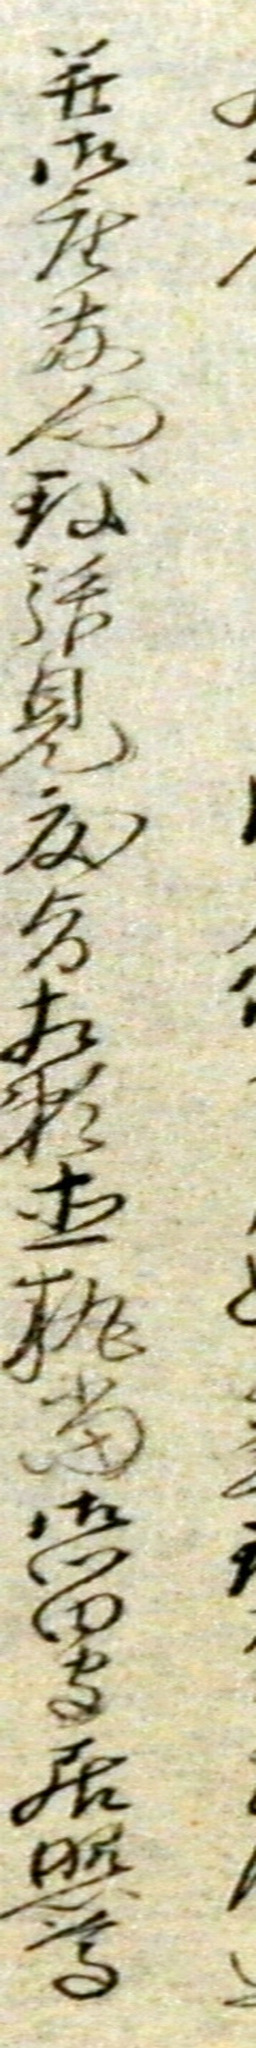幷御座敷向致拝見度旨相頼直執當御留守居照尊院

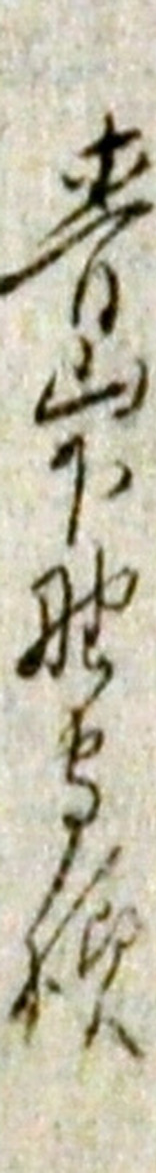青山下野守様
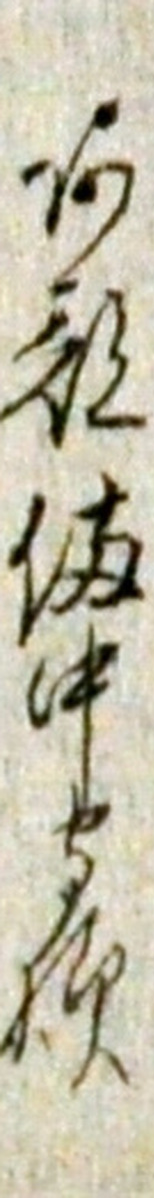阿部備中守様
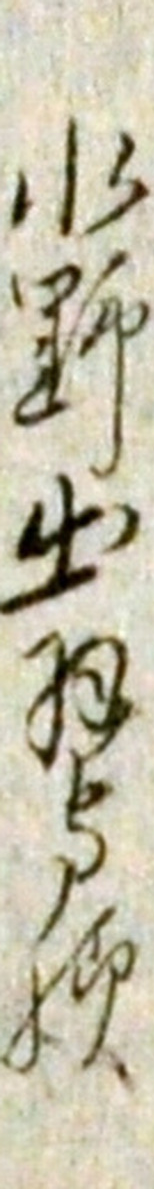水野出羽守様
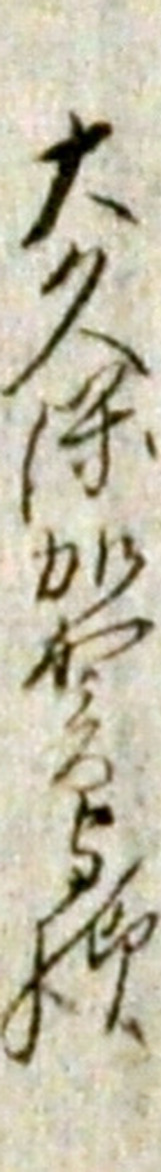大久保加賀守様
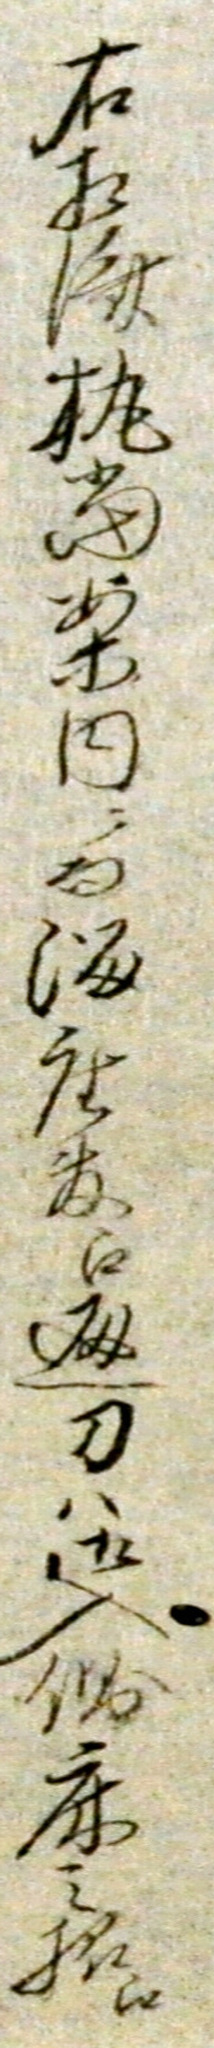右相済執當案内ニ而溜座敷江通刀ㇵ御入側床之脇江
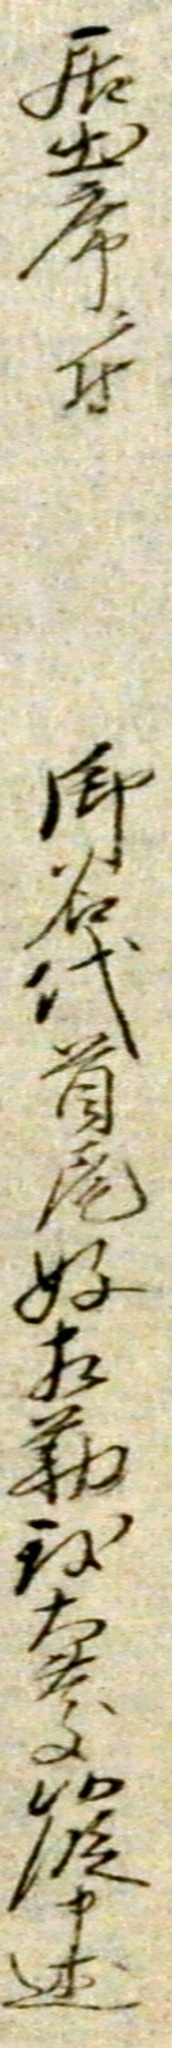居出席ニ付御名代首尾好相勤致大慶候段申述
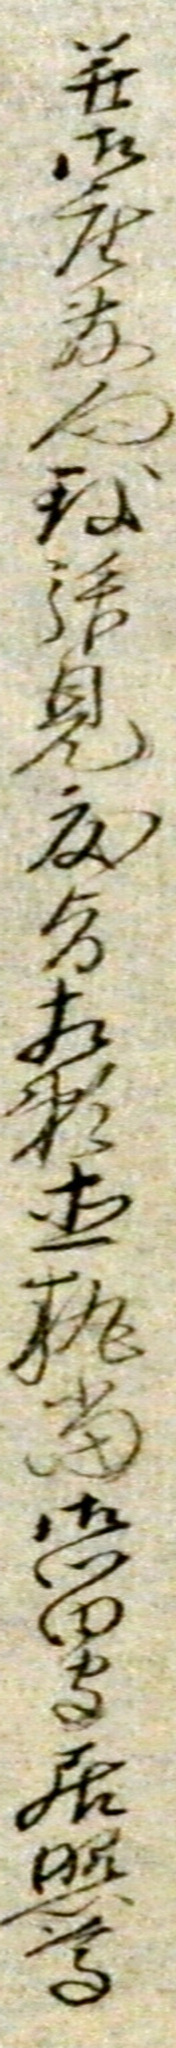幷御座敷向致拝見度旨相頼直執當御留守居照尊院
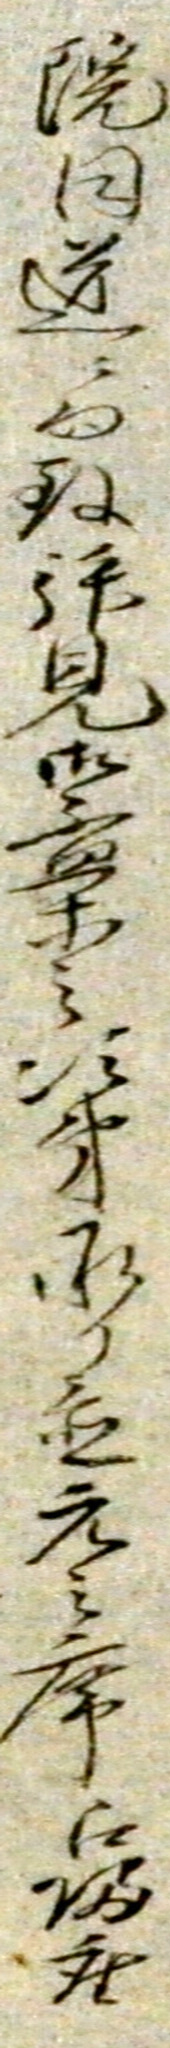同道ニ而致拝見御盃抔之次第承り置元之席江帰座
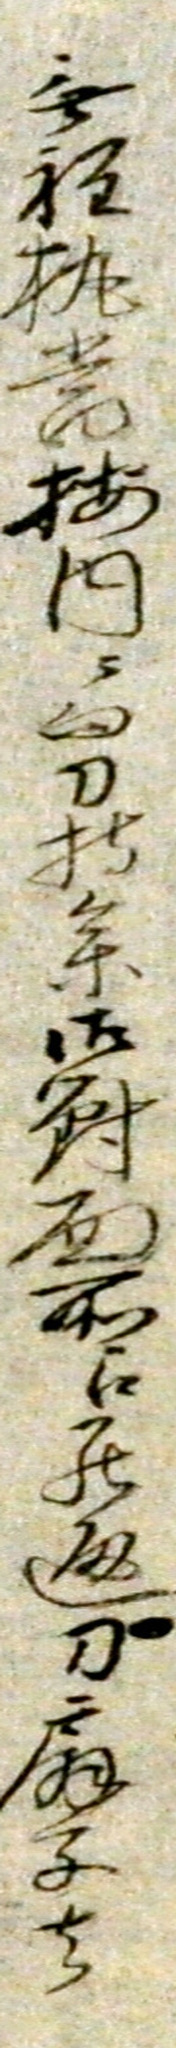無程執當按内ニ而刀持参御対所江罷通刀扇子者
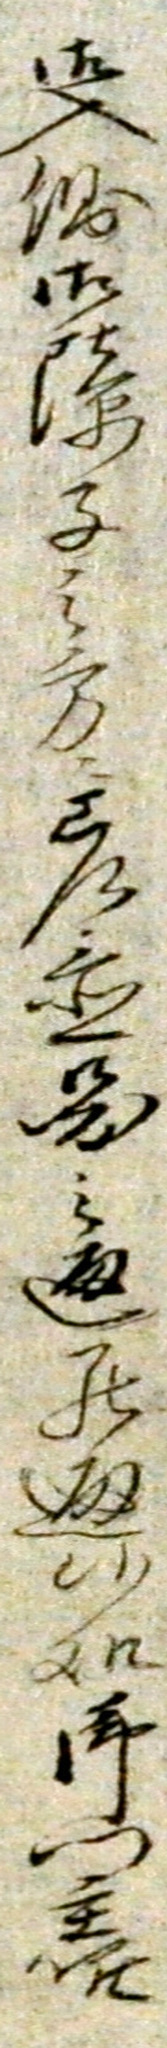御入側障子之二差置図之通罷通候処御門主唯
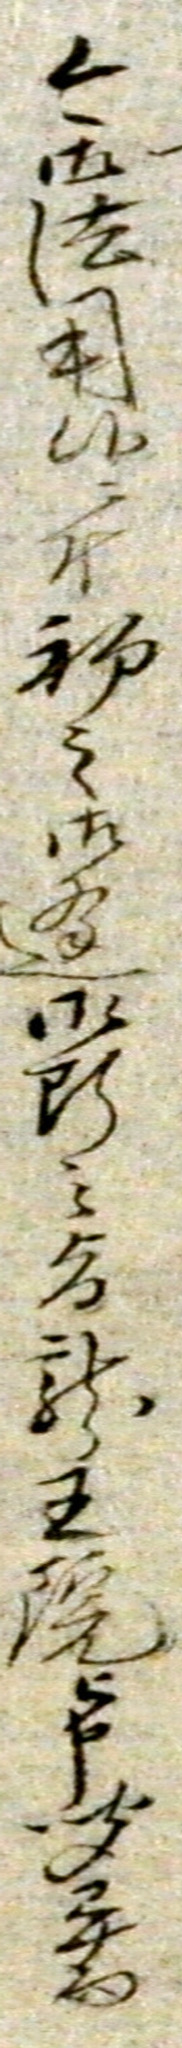今御法用候ニ付初之御逢御断之旨龍王院ヒ申聞畢而
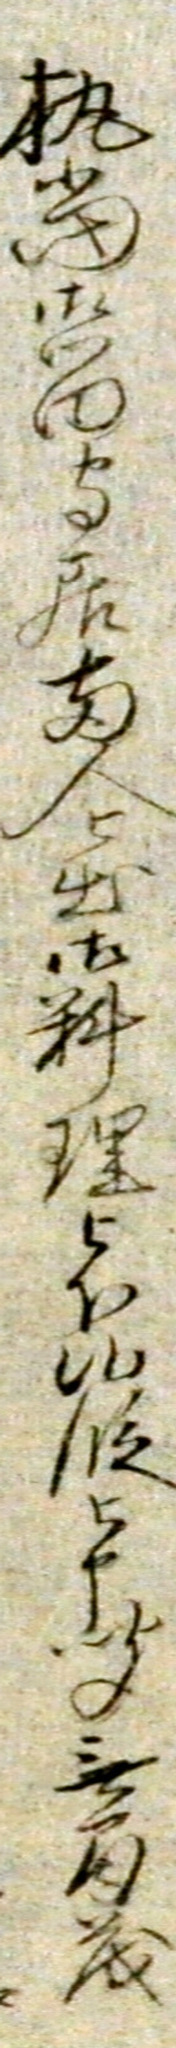執當御留守居両人ヒ出御料理ヒ下候段ヒ申聞無間茂
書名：日光御名代相勤候節ノ留
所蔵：伊那市立高遠町図書館・合同会社AMANE
